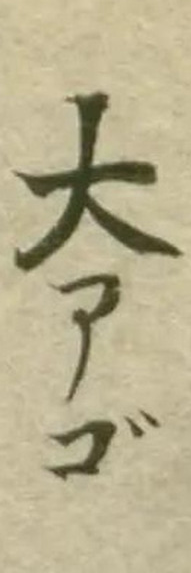大アゴ
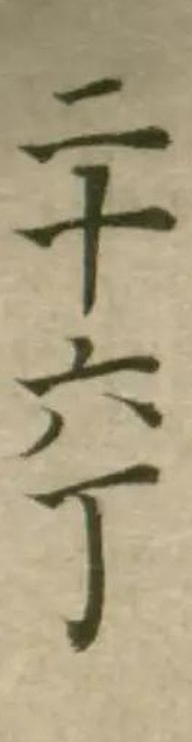二十六丁

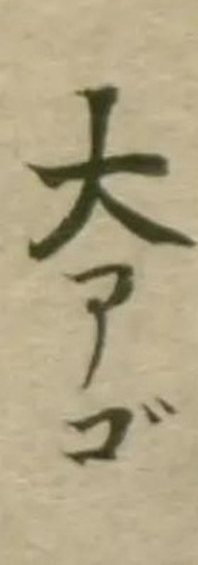大アゴ
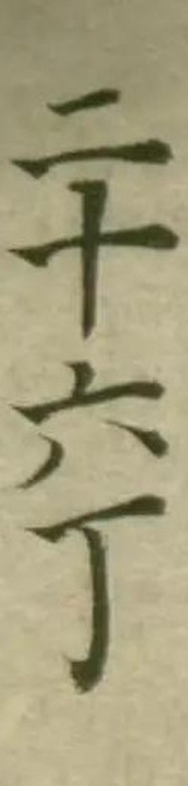二十六丁
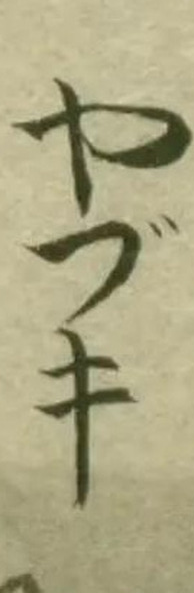ヤブキ
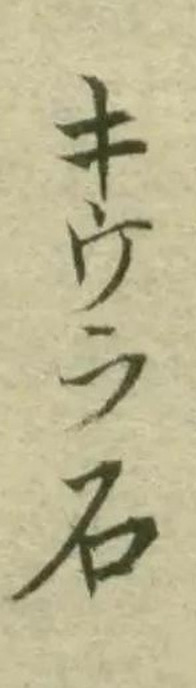キウラ石
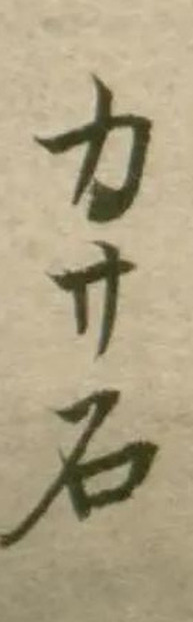カサ石

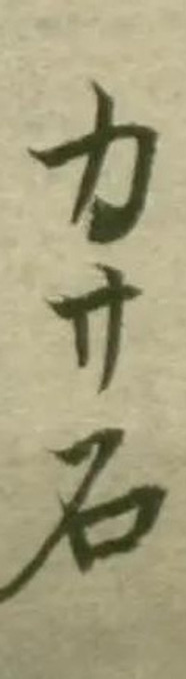カサ石
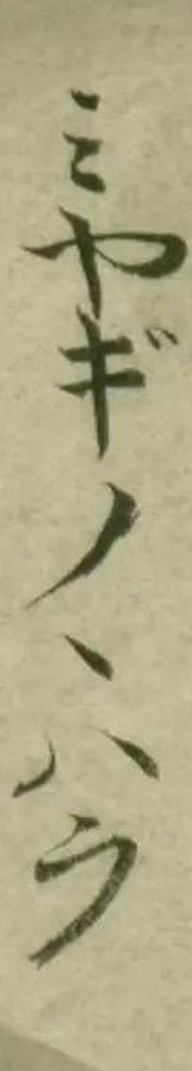ミヤギノヽハラ
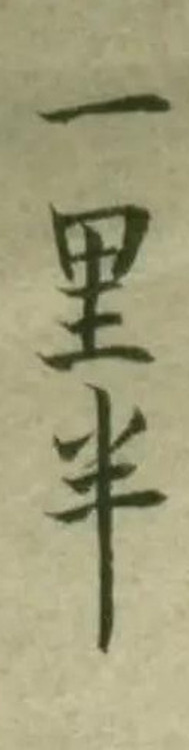一里半
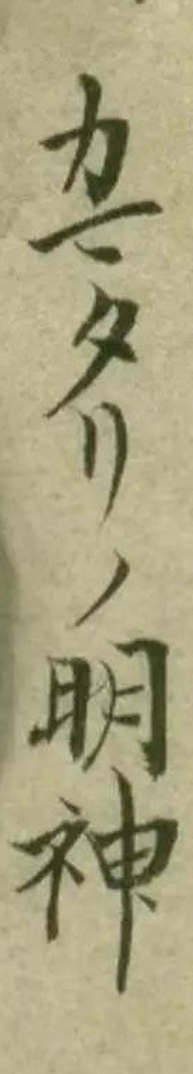カマタリノ明神
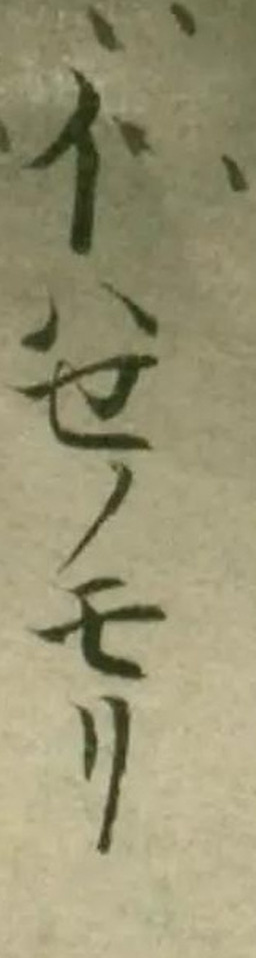イハセノモリ
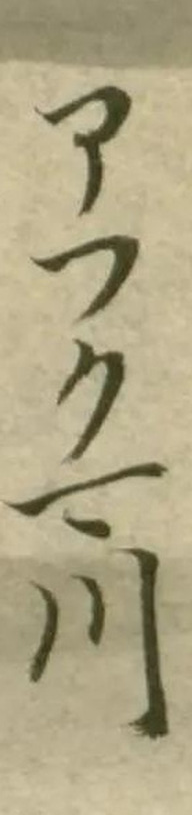アフクマ川

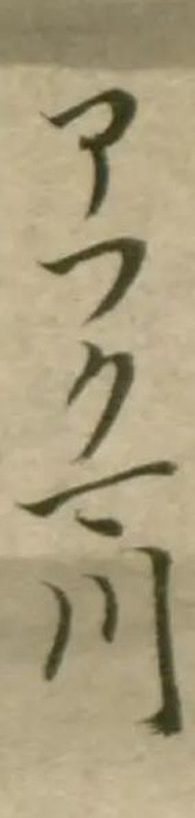アフクマ川
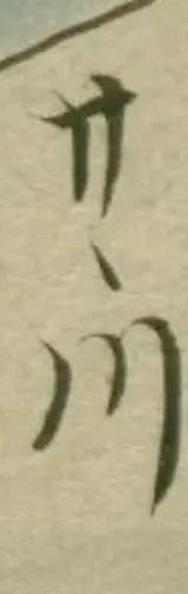サヽ川
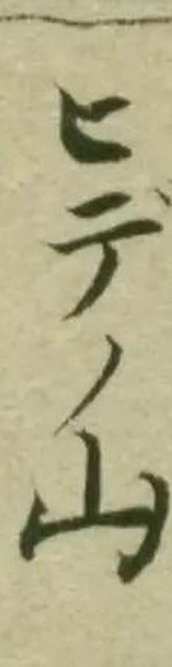ヒデノ山
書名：江戸より奥州津輕迄道筋之圖
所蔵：国立国会図書館 National Diet Library, JAPAN
